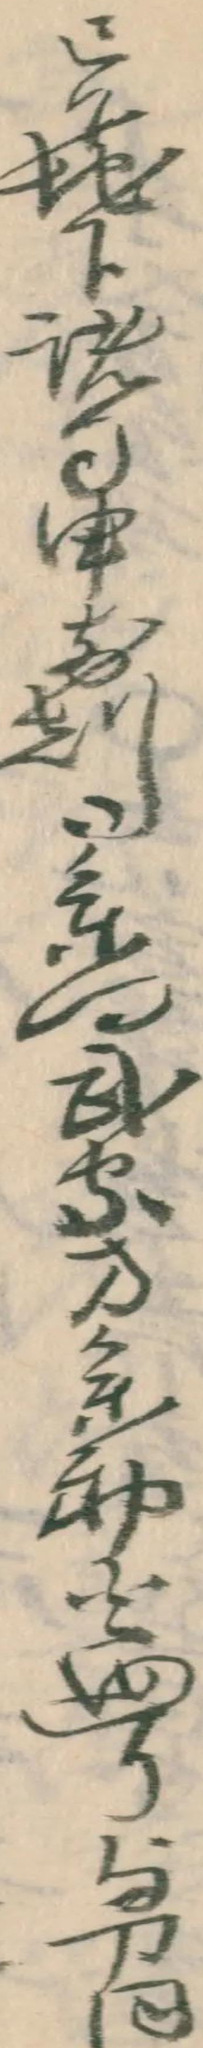已下地下諸司申前刻御参向武家方参勤国廻り与力同
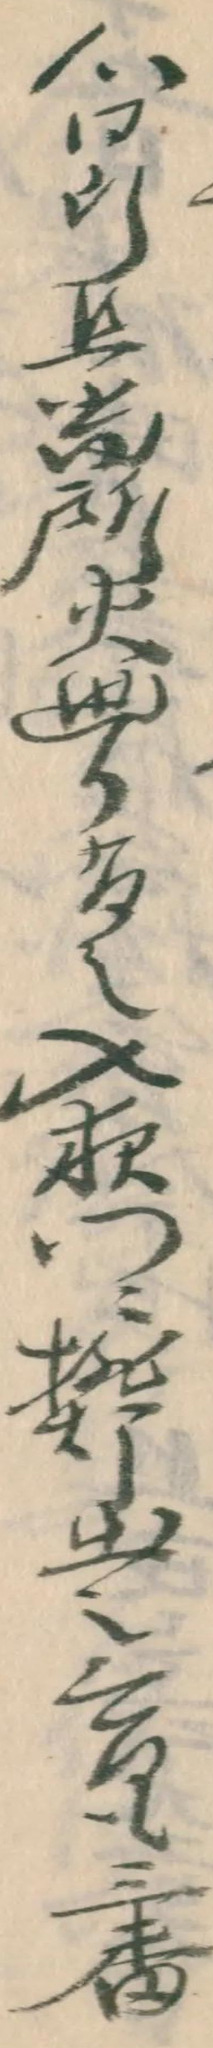心同断且当所火廻り有之入夜門ニ挑灯出也今日も三番
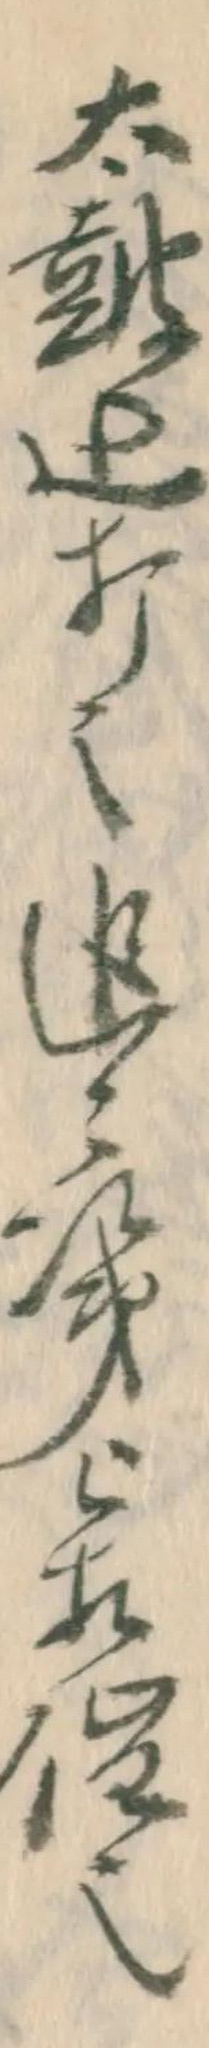太皷廻打之追々次第被相催也
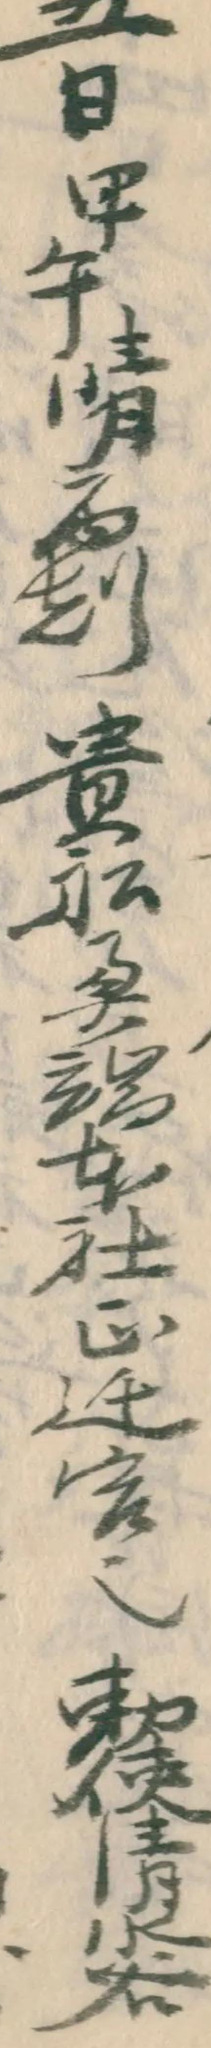五日甲午晴酉刻貴舩奥端本社正遷宮也勅使清水谷
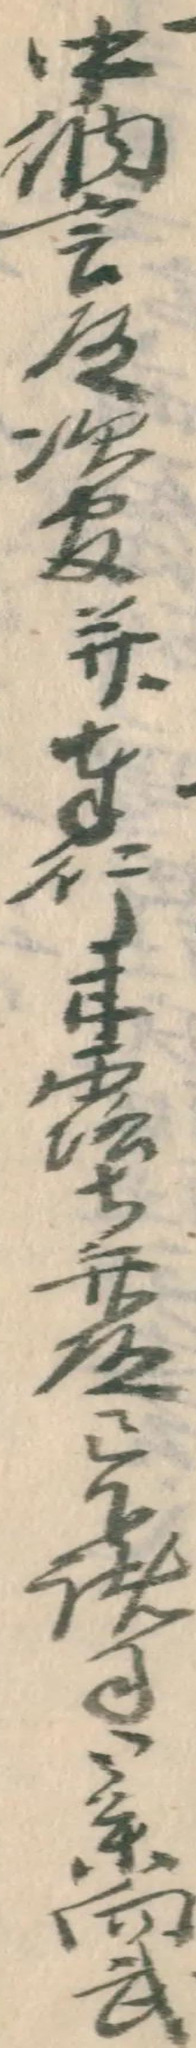中納言殿次官幷奉行甘露寺弁殿已下諸司御参向武
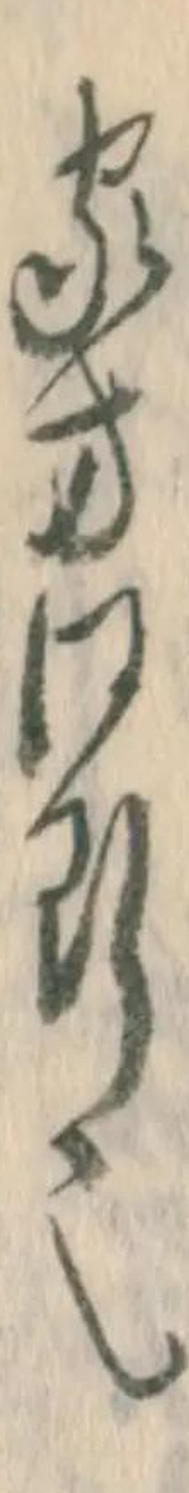家方同断也
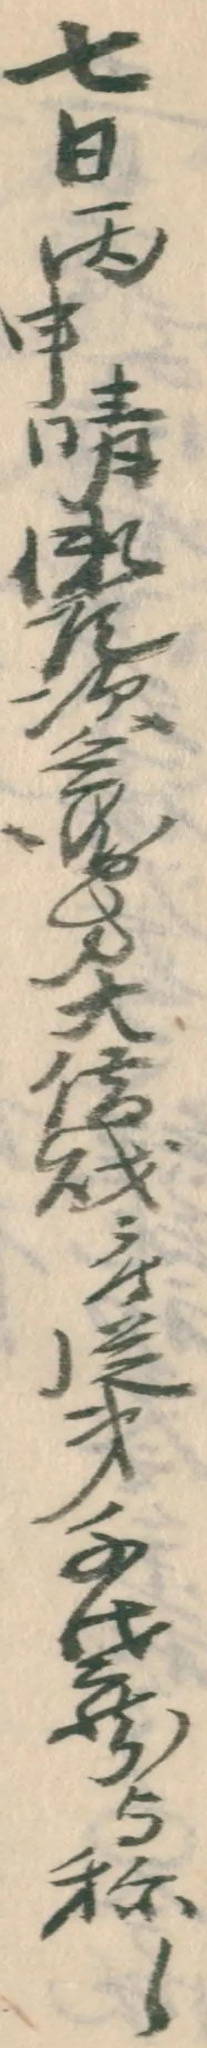七日丙申晴瀬尾次兵衛方大借財ニ付従弟千代蔵と称し
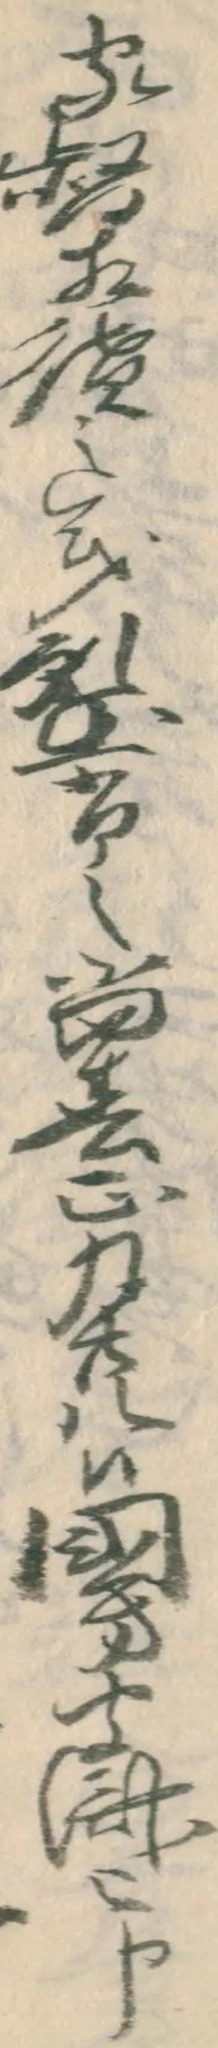家督相續之義願出有之当春正月廿八日国方半済被申
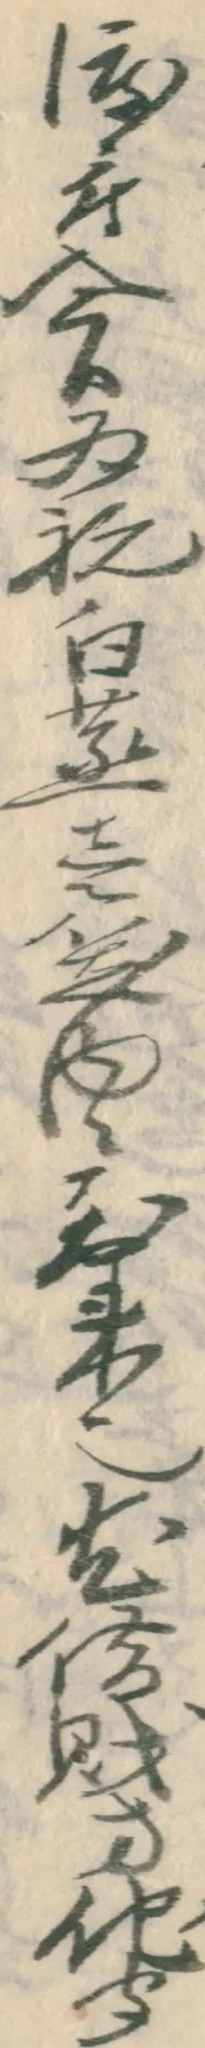渡ニ付今日為祝白蒸壱袋内に到来也尤借財方他聞
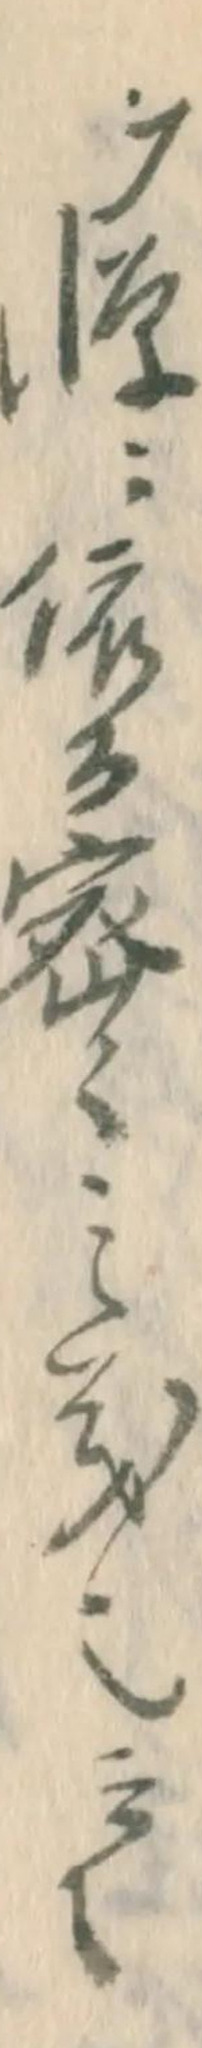ヲ憚ニ依而密々之義也云々
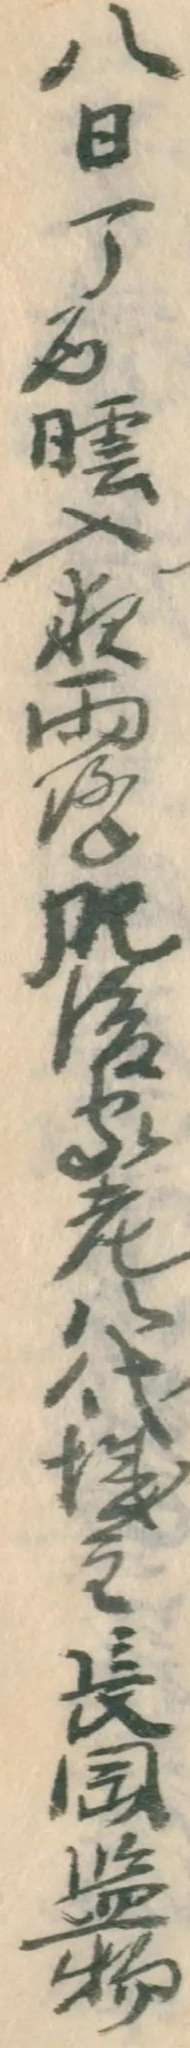八日丁酉晴入夜雨降肥後家老八代城主長岡監物

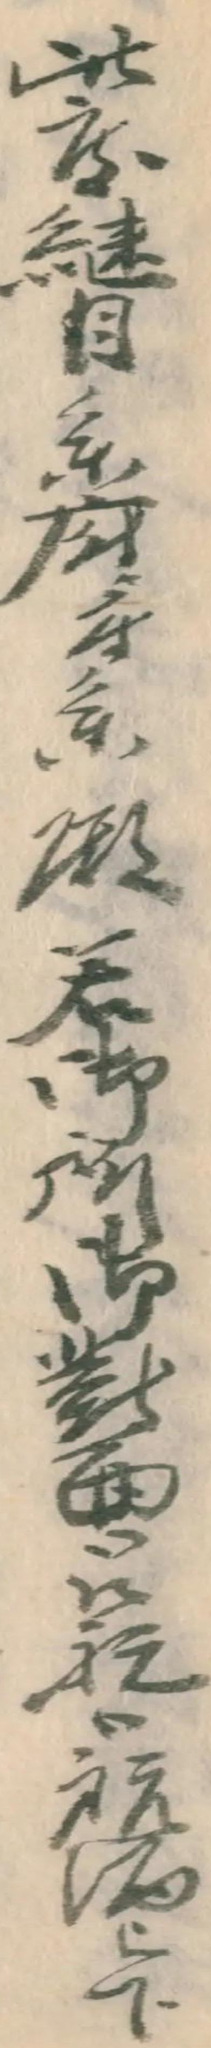此度継目参府ニ付参殿若御所御對面候御祝御祝酒被下
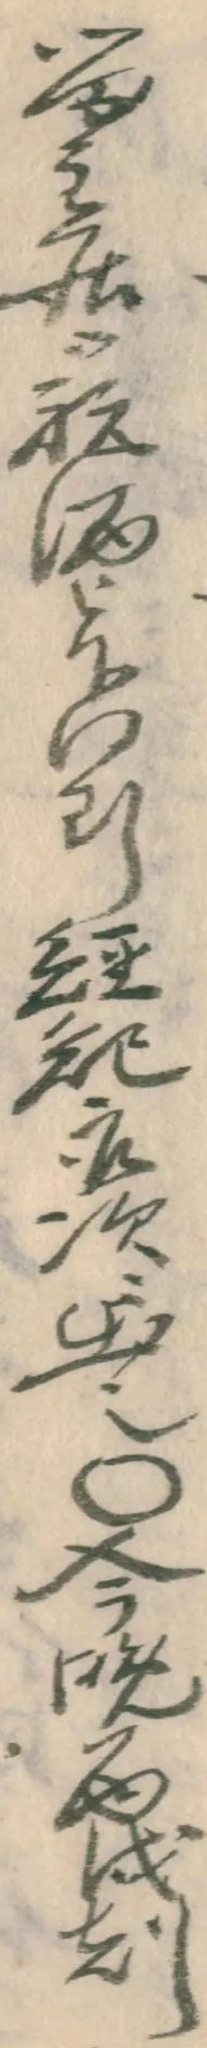留主居御祝酒被下同断経紀取次ニ出之○今晩酉戌刻
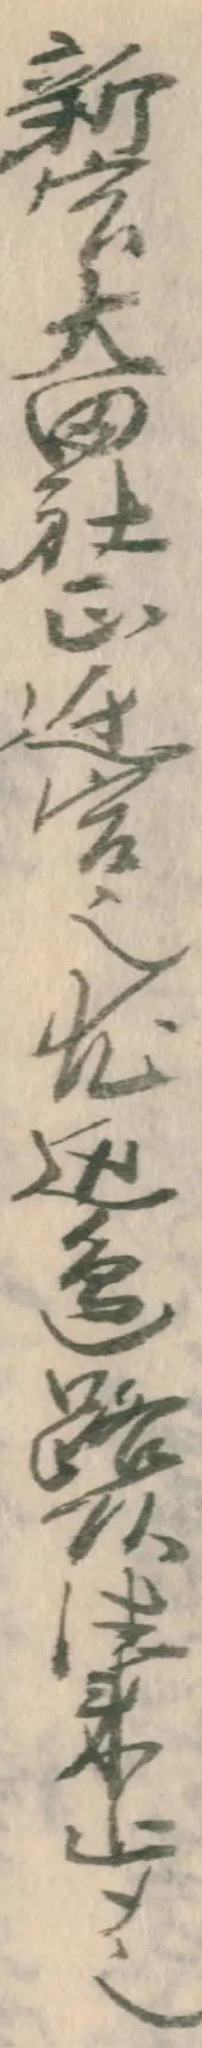新宮大田社正遷宮也尤近邊路頭往来止メ也
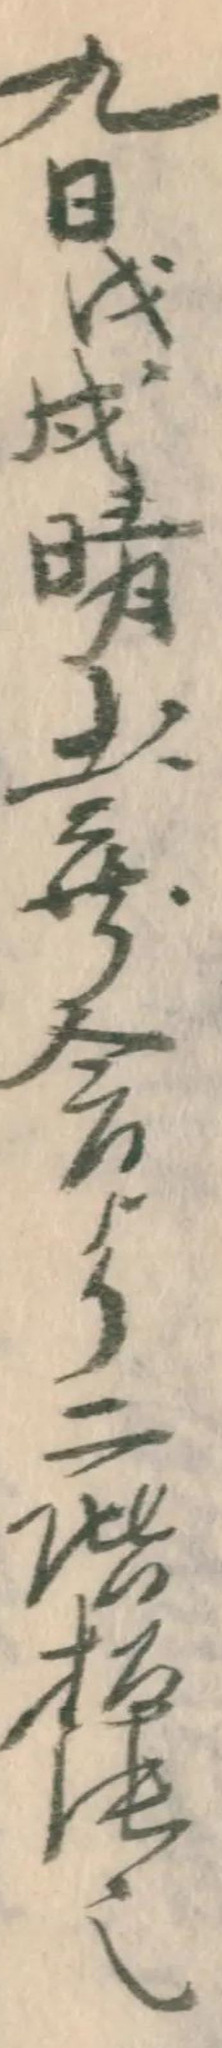九日戊戌晴出蔵今日より二階板張也
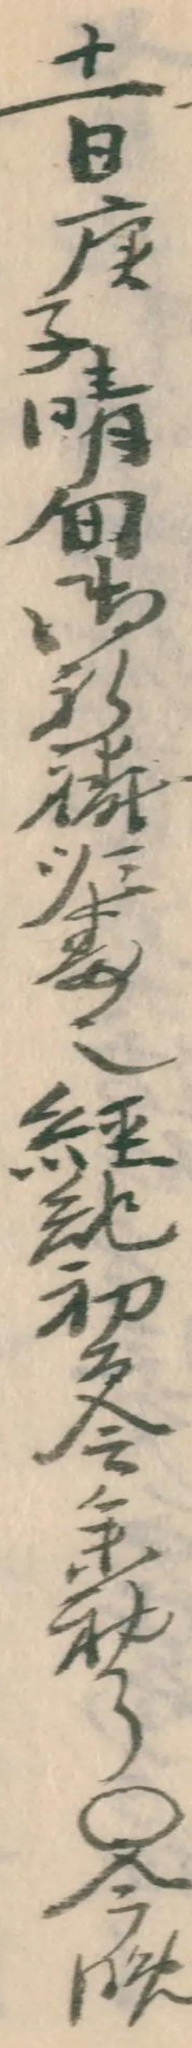十一日庚子晴旬御祈祷順番也経紀初而令参社了○今晩
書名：賀茂社記録. 第67冊
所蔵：国立国会図書館 National Diet Library, JAPAN
